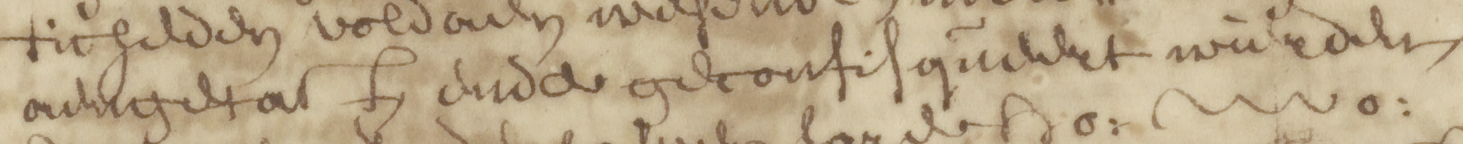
aengetast, ende geconfisqueert wierden,
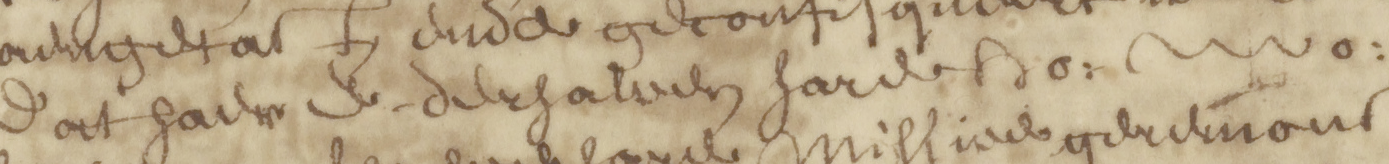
dat haer E. derhalven hare Ho:Mo:
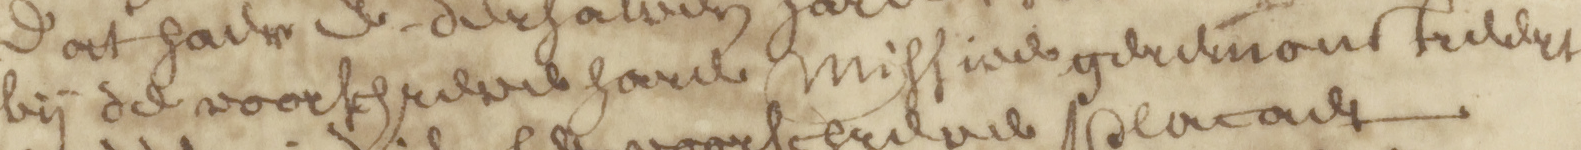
bij de voorschreve hare Missive geremonstreert
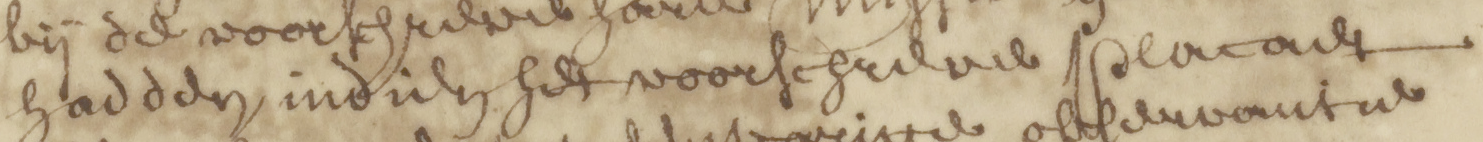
hadden, indien het voorschreve Placaet
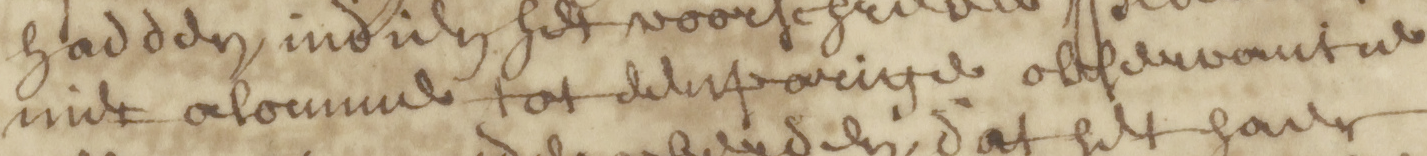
niet alomme tot eenparige obervantie
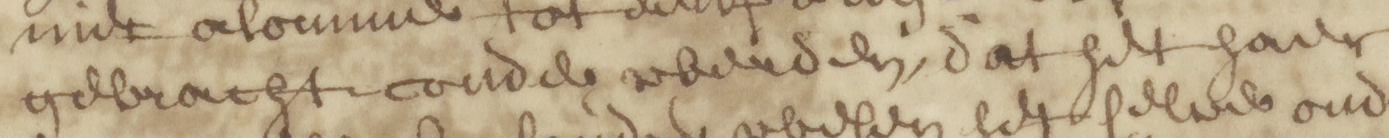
gebracht conde werden, dat het haer
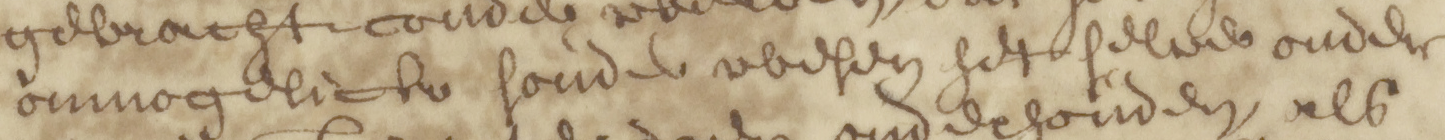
onmogelick soude wesen het selve onder
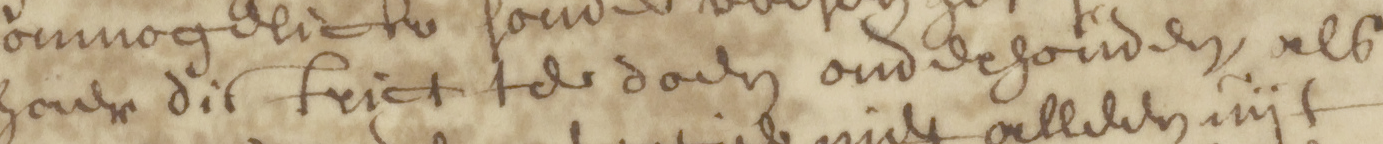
haer district te doen onderhouden, als
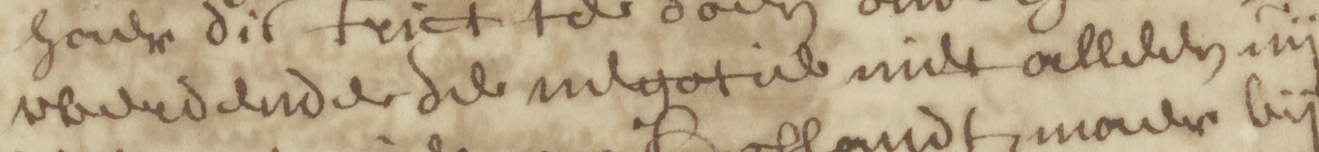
werdende de negotie niet alleen uijt
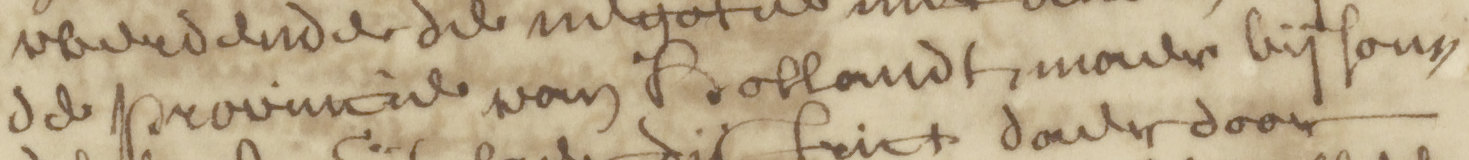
de Provincie van Hollandt, maer bijson„
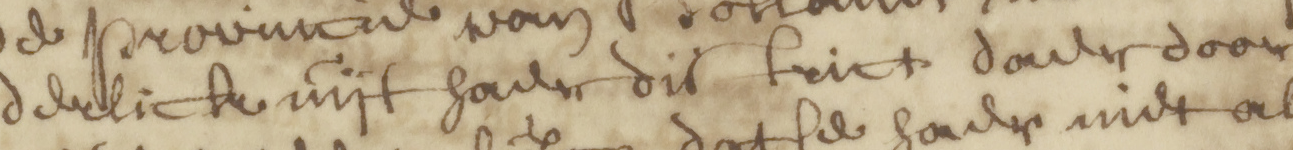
derlick uijt haer district daer door
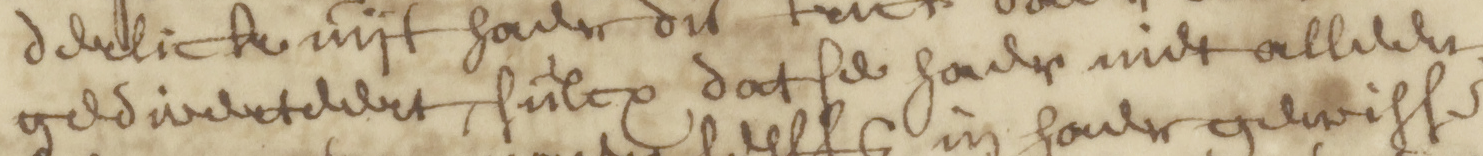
gediverteert, sulcx datse haer niet alleen
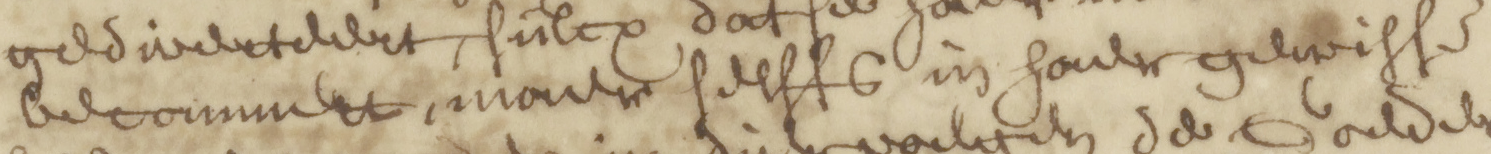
becommert, maer selffs in haer gewisse
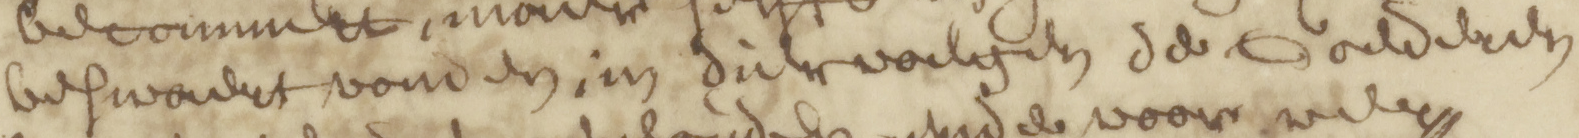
beswaert vonden, in diervoegen de Goederen
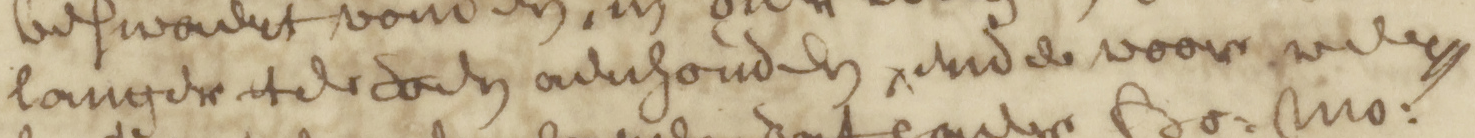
langer te doen aenhouden, ende voor ver„
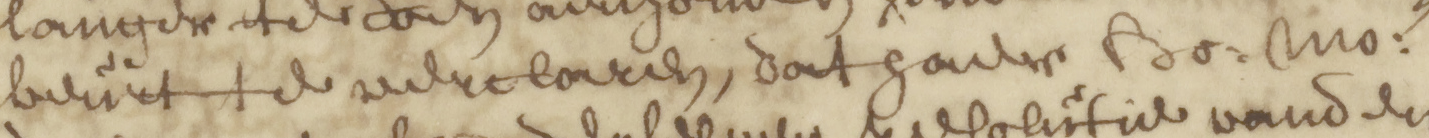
beurt te verclaren, dat haer Ho:Mo:
